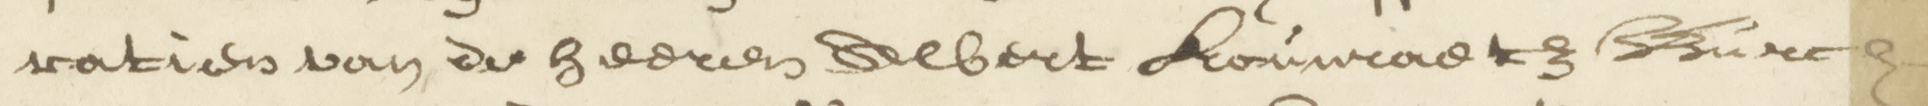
ratien van de heeren Albert Kounraetz Burch
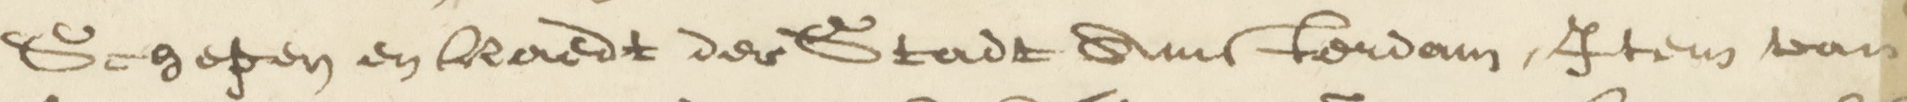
Schepen en Raedt der Stadt Amsterdam, Item van
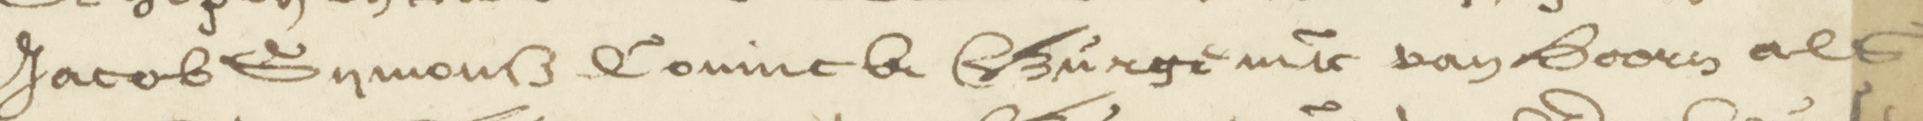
Jacob Symonss Coninck Burgemr van Hoorn als
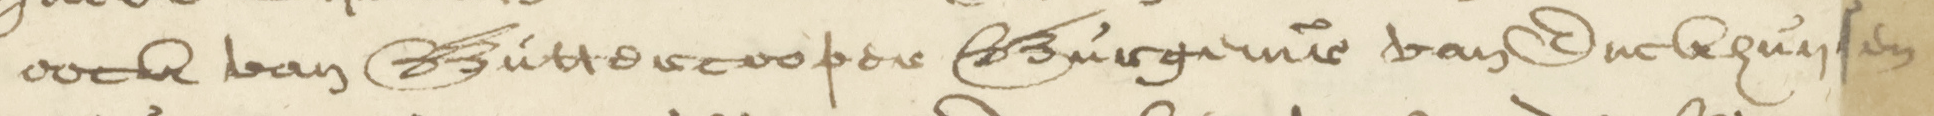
oock van Buttercooper Burgemr van Enckhuysen
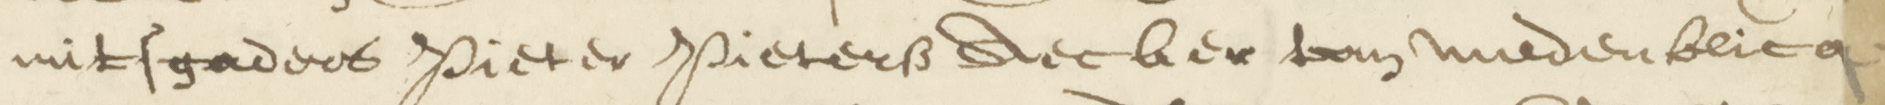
mitsgaders Pieter Pieters Aecker van medenblicq
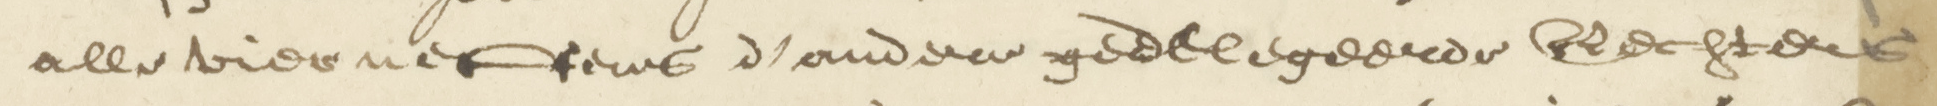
alle vier neffens d'andere gedelegeerde rechtens
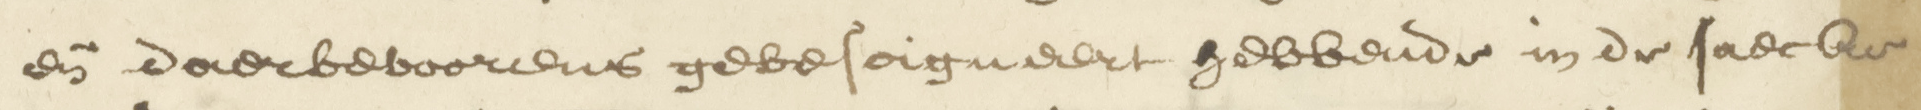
en daerbevoorens gebesoigneert hebbende in de saecke
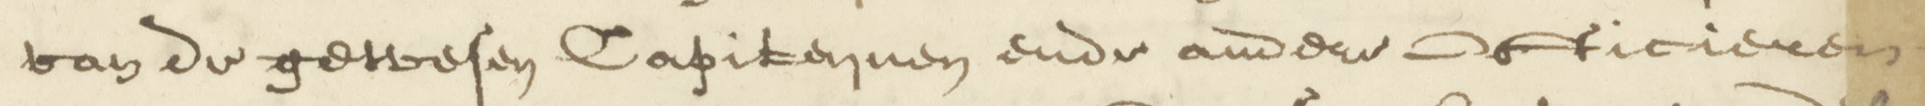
van de gewesen Capiteynen ende andere Officieren
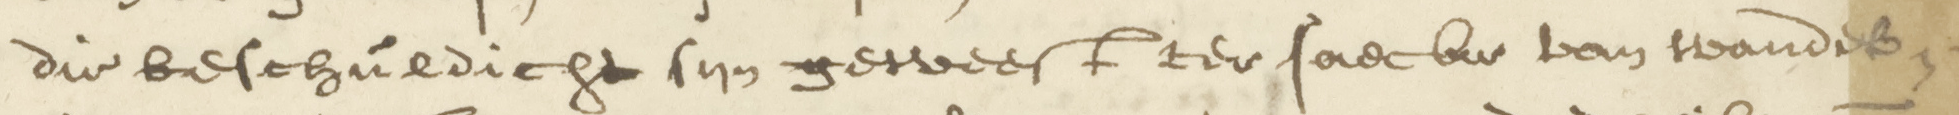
die beschuldicht syn geweest ter saecke van wandeb„
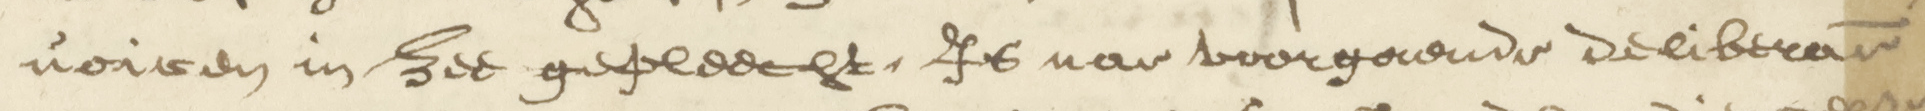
uoiren in Zee gepleecht. Is nae voorgaende deliberae
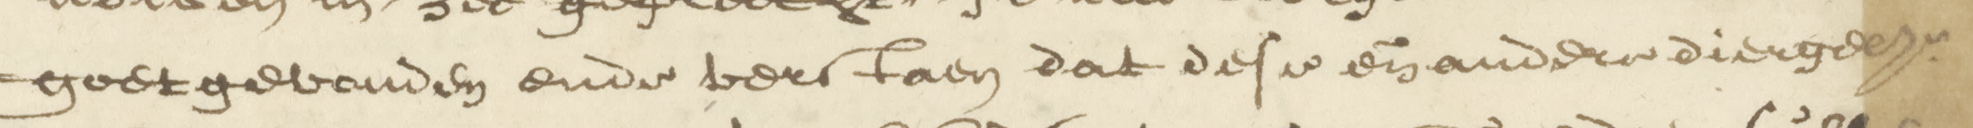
goetgevonden ende verstaen dat dese en andere diergeln.
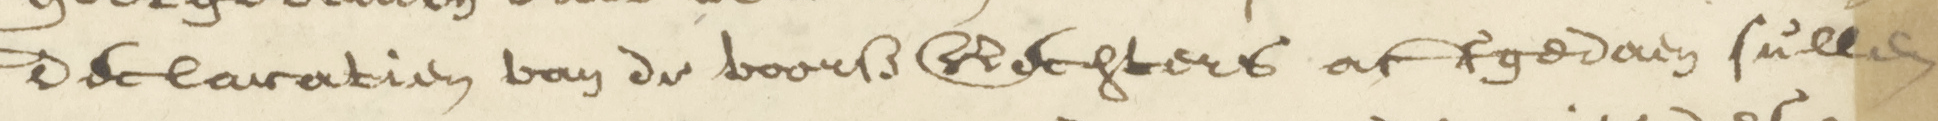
declaratien van de voors Rechters affgedaen sullen
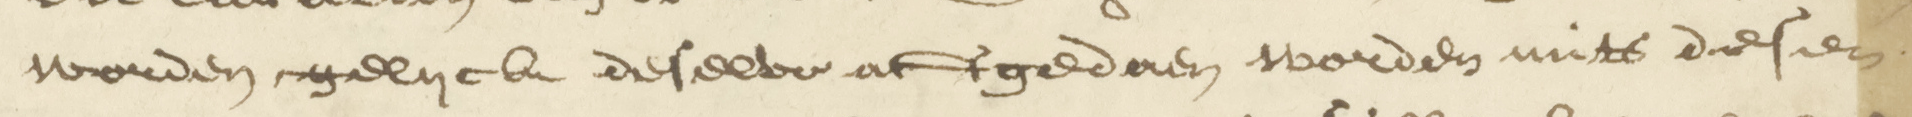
worden gelyck deselve affgedaen worden mits desen
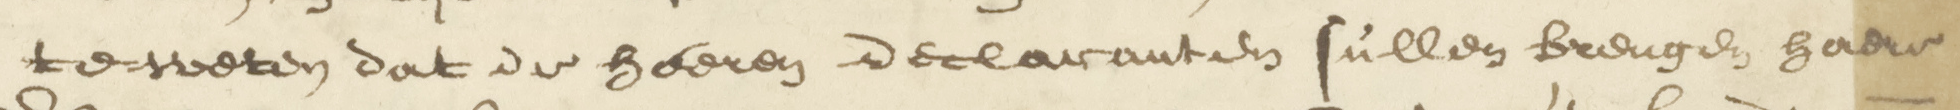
te weten dat de heeren declaranten sullen brengen haer
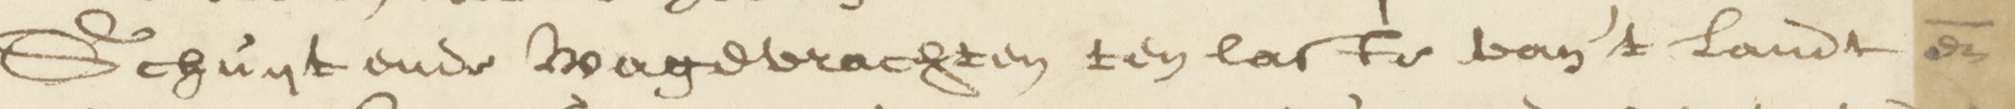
Schuyt ende Wagevrachten ten laste van 't Landt en
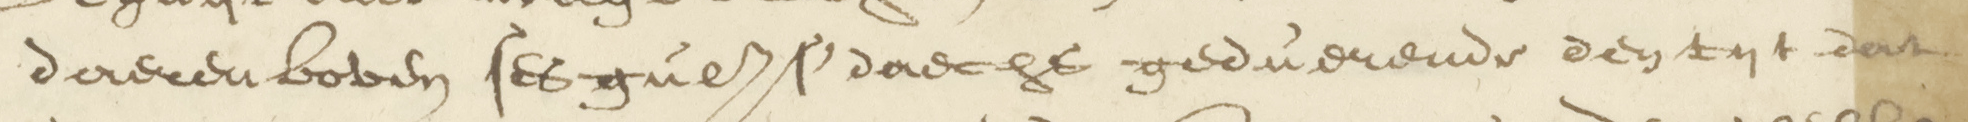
daeren boven ses gul s‛daechs geduerende den tyt dat
